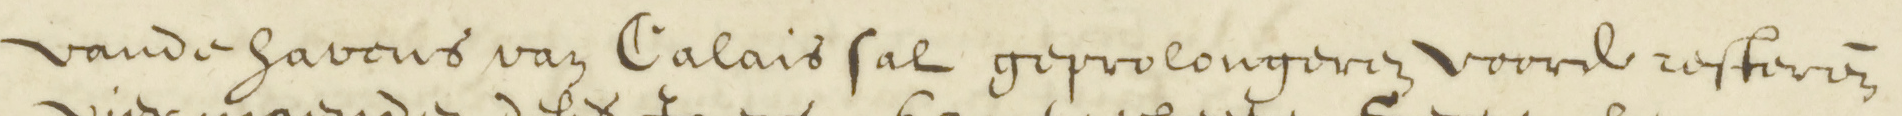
vande havens van Calais sal geprolongeren voorde resteren
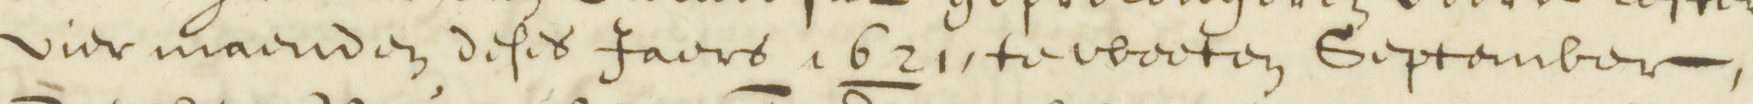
vier maenden deses Jaers 1621, te weeten September,
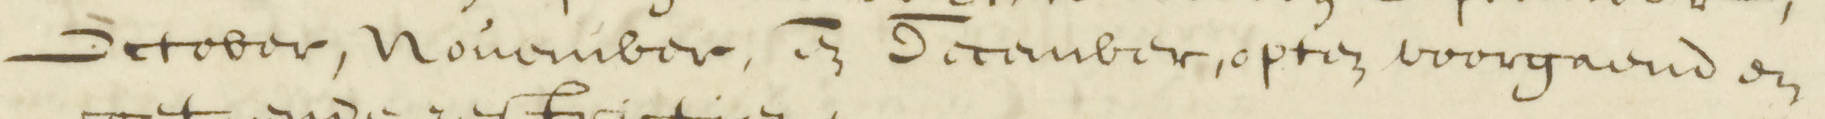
October, Nouember, en December, opten voorgaenden
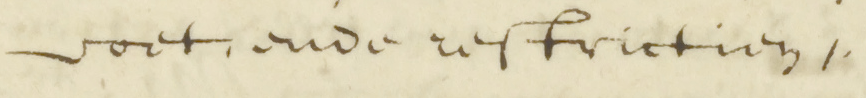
voet, ende restrictien.
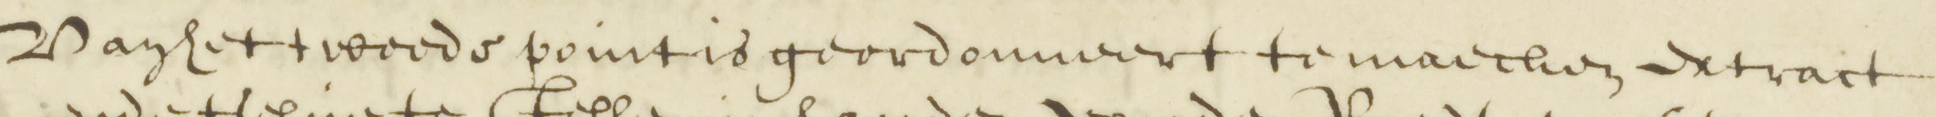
Van het tweede point is geordonneert te maecken extract
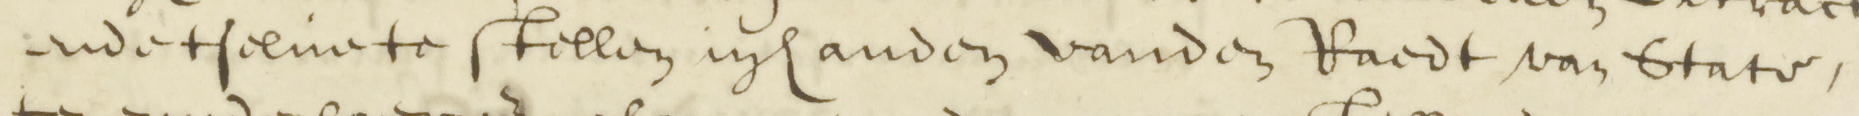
ende tselve te stellen in handen vanden Raedt van State,
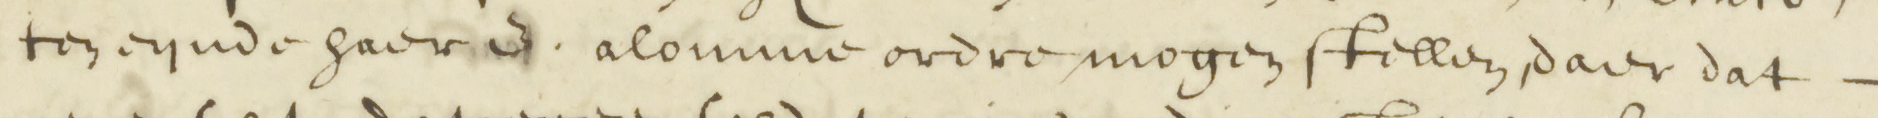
ten eynde haer E. alomme ordre mogen stellen, daer dat -
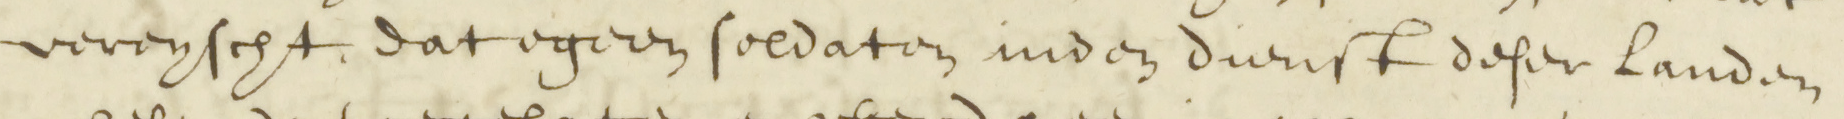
vereyscht, dat egeen soldaten inden dienst deser Landen
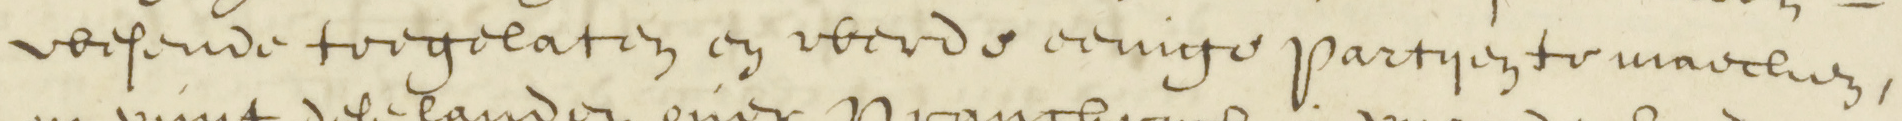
wesende toegelaten en werde eenige partyen te maecken,
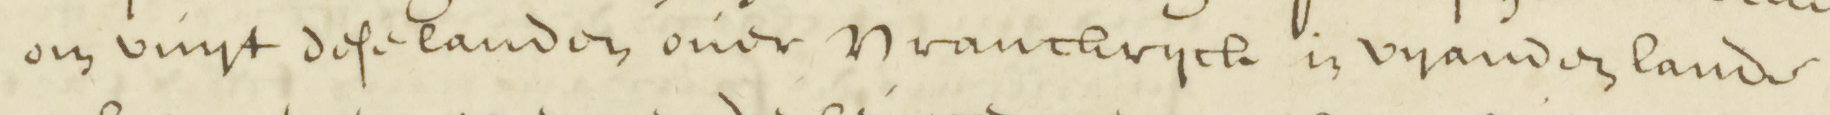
om vuyt dese landen ouer Vranckryck in vyanden lande
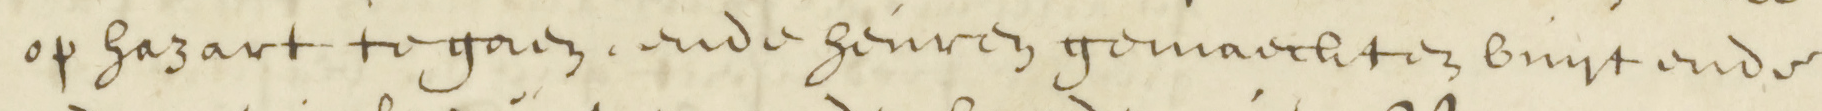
op hazart te gaen, ende heuren gemaeckten buyt ende
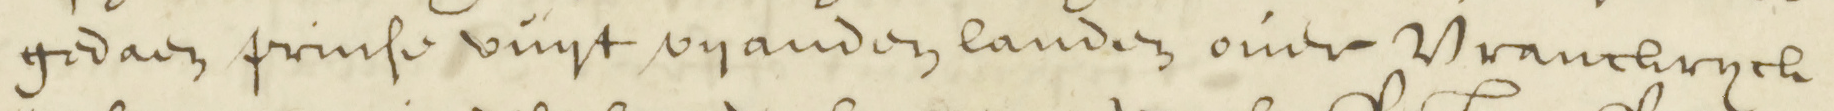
gedaen prinse vuyt vyanden landen ouer Vranckryck
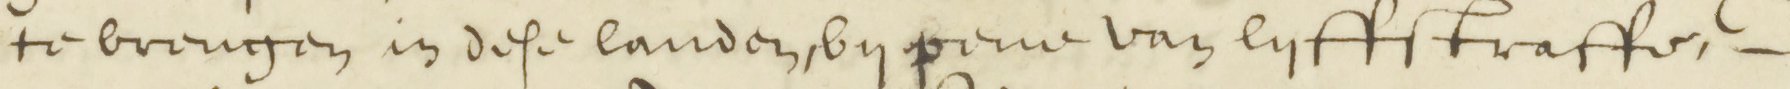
te brengen in dese landen, by pene van lyffstraffe,
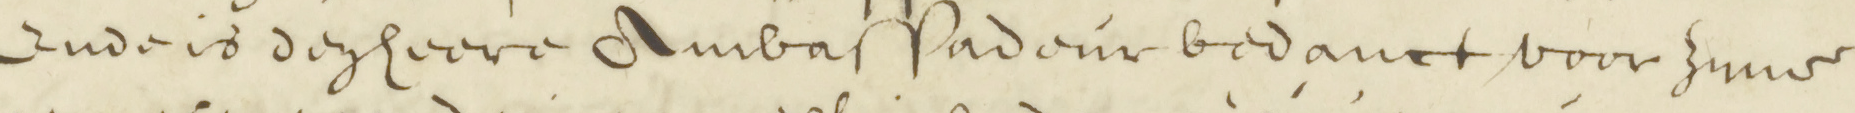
Ende is den heere Ambassadeur bedanct voor zyne
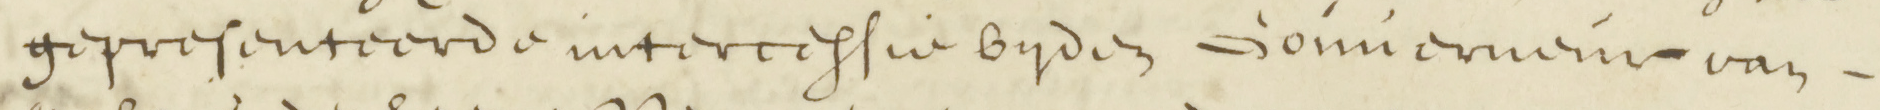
gepresenteerde intercessie byden Gouuerneur van
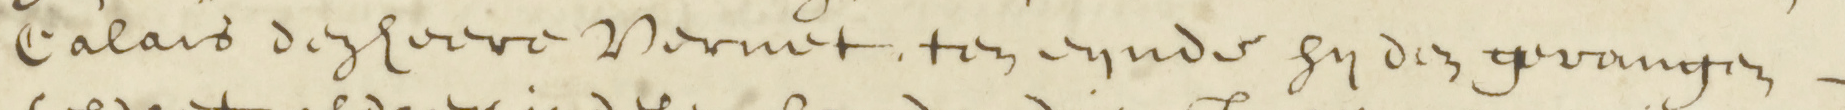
Calais den heere Vernet, ten eynde hy den gevangen
